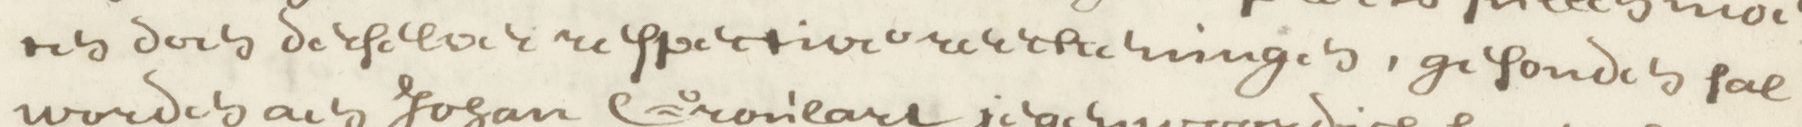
ten doen derselver respective reeckeningen, gesonden sal
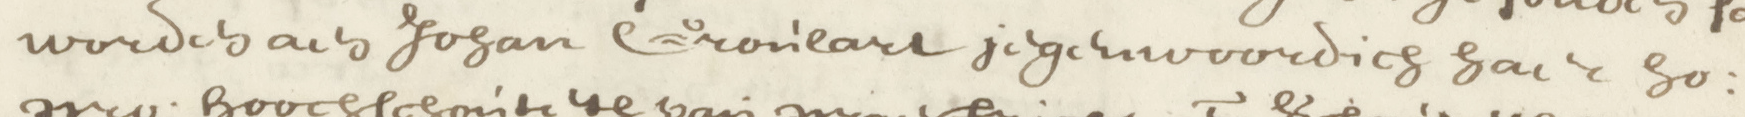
worden aen Johan Groulart jegenwoordich haer Ho:
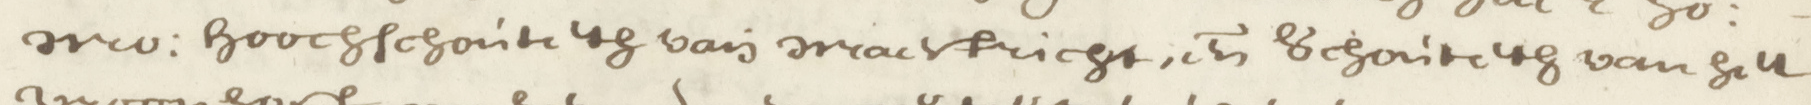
Mo: hoochschouteth van Maestricht en Schouteth van het
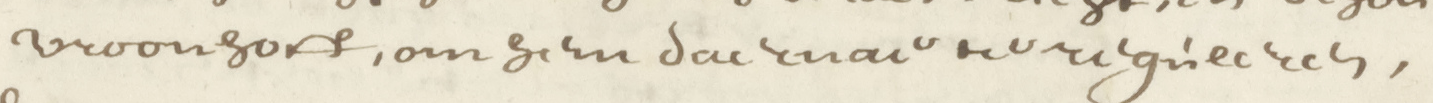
vroonhoff, om hem daernae te reguleren.
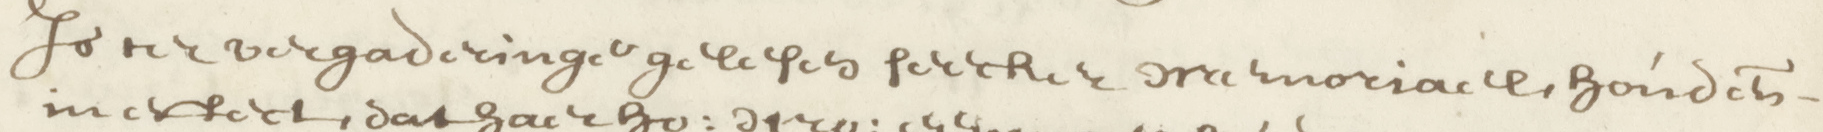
Is ter vergaderinge gelesen seecker memoriael houden
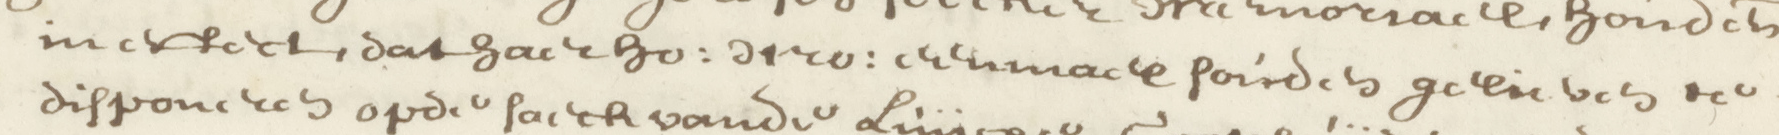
in effect dat haer Ho:Mo: eenmael souden gelieven te
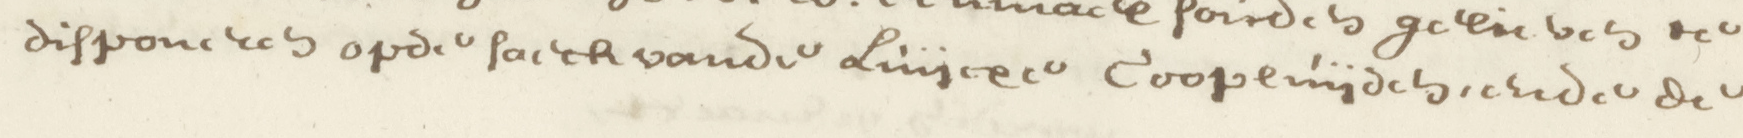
disponeren opde saeck vande Luijcxe Coopluijden, ende de
